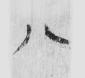八
